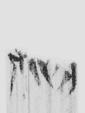則
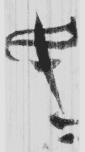民=
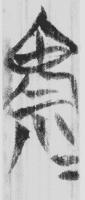{鬼示}=
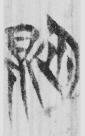則
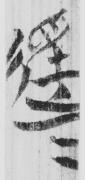辶㸒=
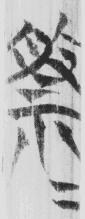祭=
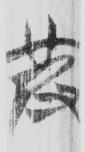皮
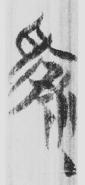{爪家}
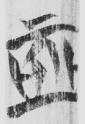亟
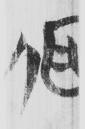佴
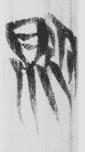則
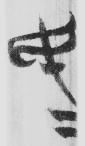民=
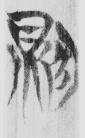則
